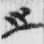之
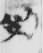死
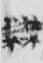無
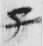子
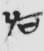左
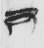尹
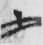士
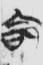命
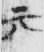亓（其）
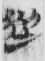從
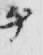父
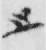之
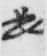弟
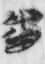番
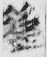○（後）
